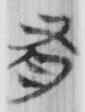有
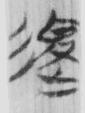退
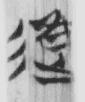進
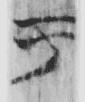于
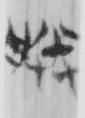朕
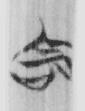命
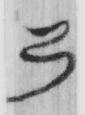乃
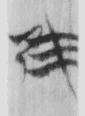隹
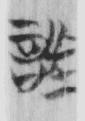{言亡壬}
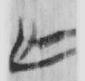亡
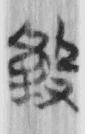{夆殳}
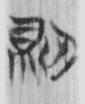則
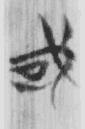或
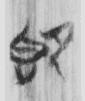即
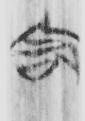命
